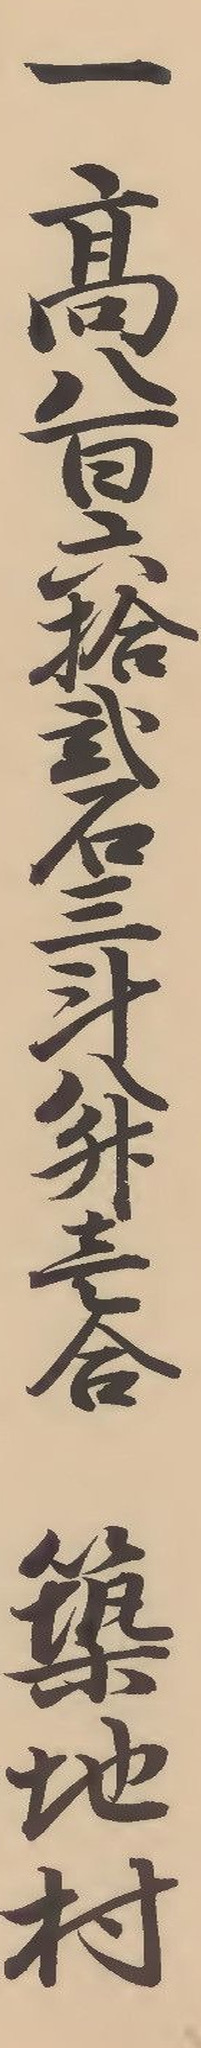一高八百六拾弐石三斗八升壱合築地村
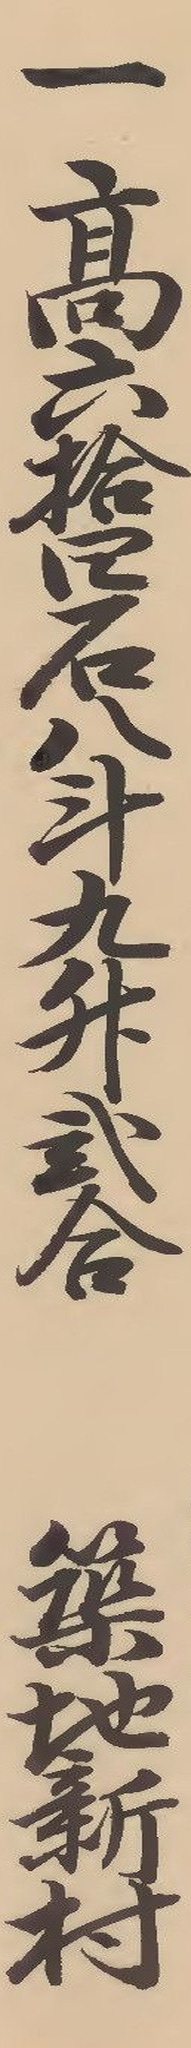一高六拾四石八斗九升弐合築地新村
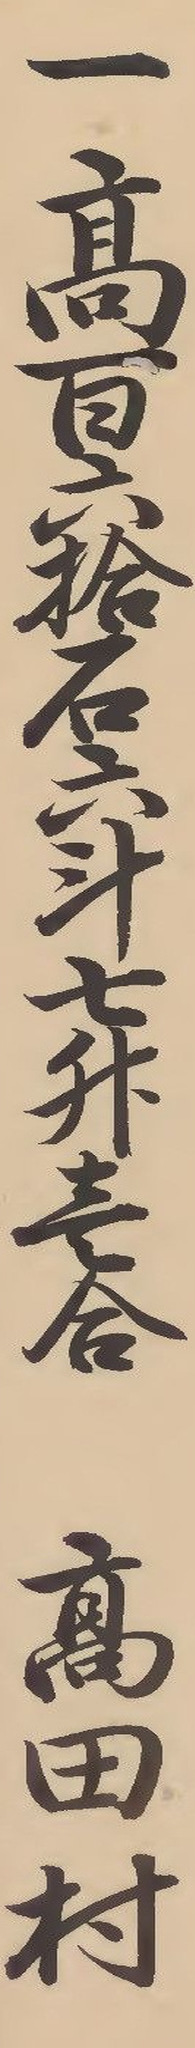一高百六拾石六斗七升壱合高田村
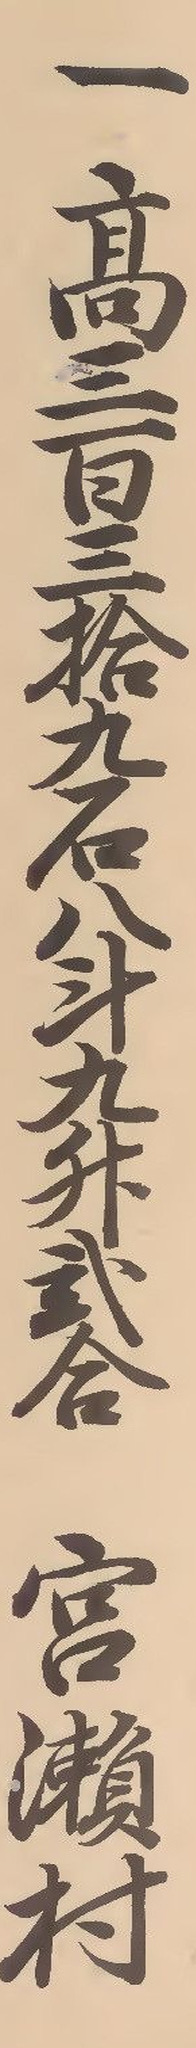一高三百三拾九石八斗九升弐合宮瀬村
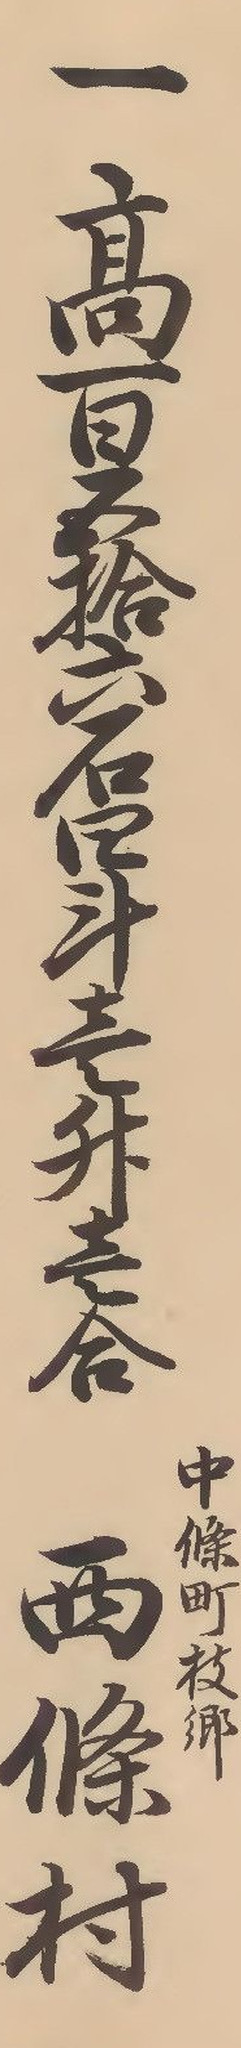一高百五拾六石四斗壱升壱合西条村
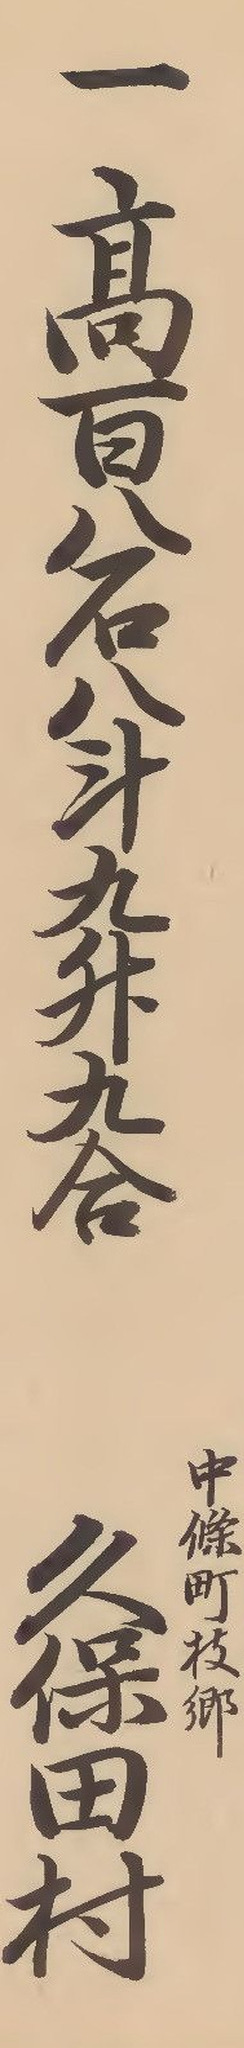一高百八石八斗九升九合久保田村
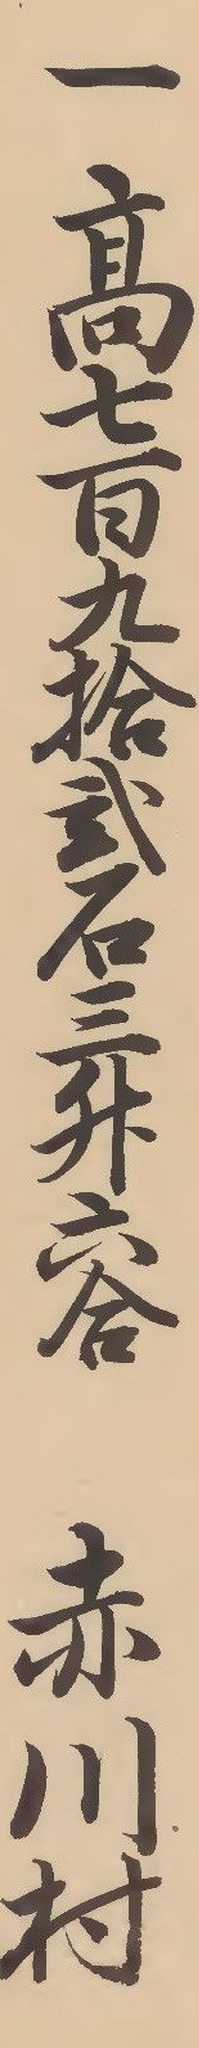一高七百九拾弐石三升六合赤川村

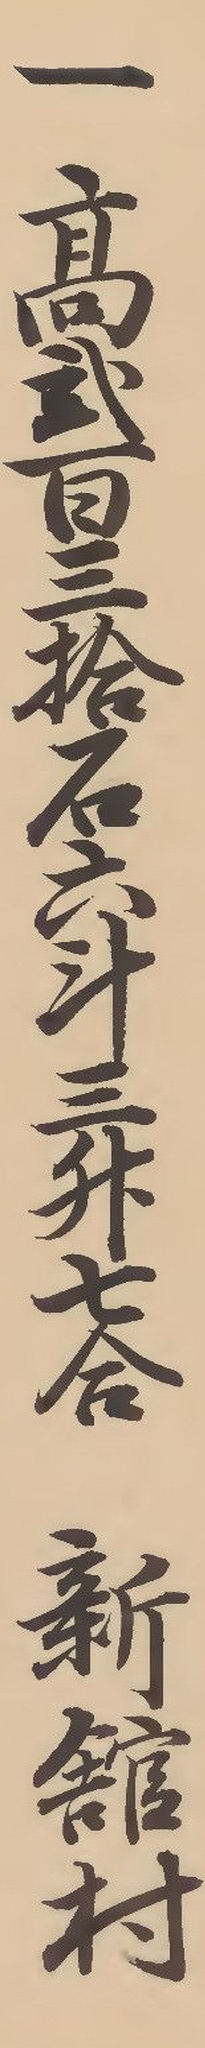一高弐百三拾石六斗三升七合新館村
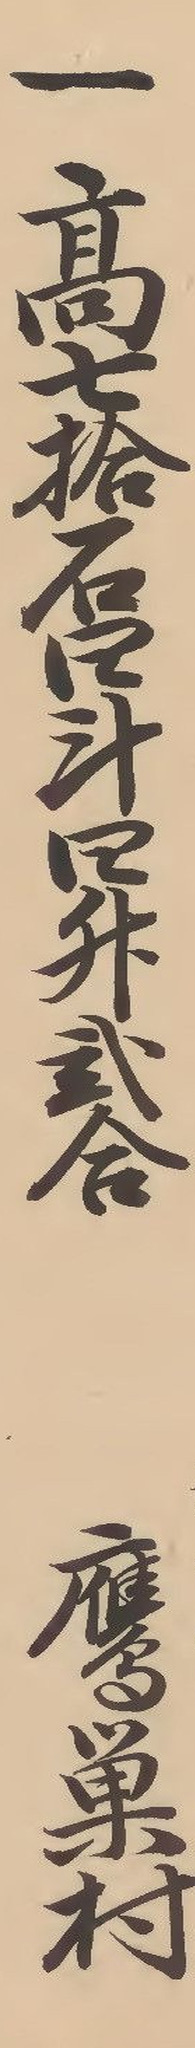一高七拾石四斗四升弐合鷹巣村
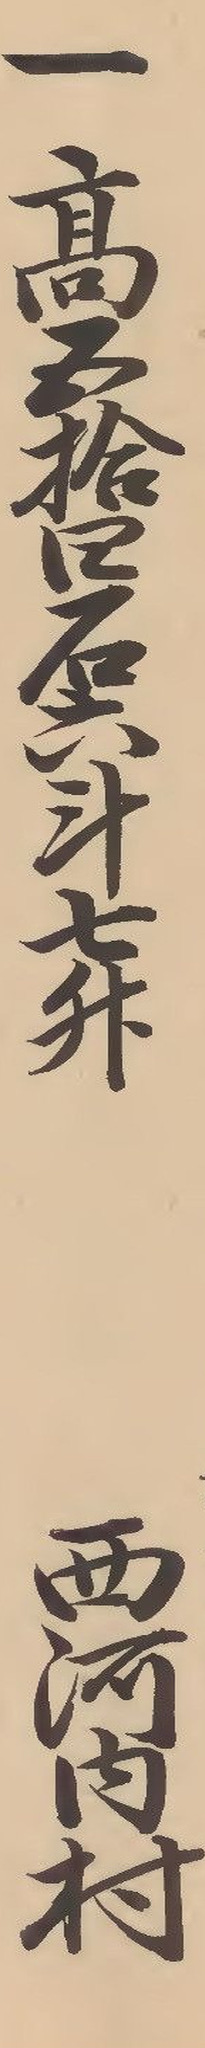一高五拾四石六斗七升西河内村
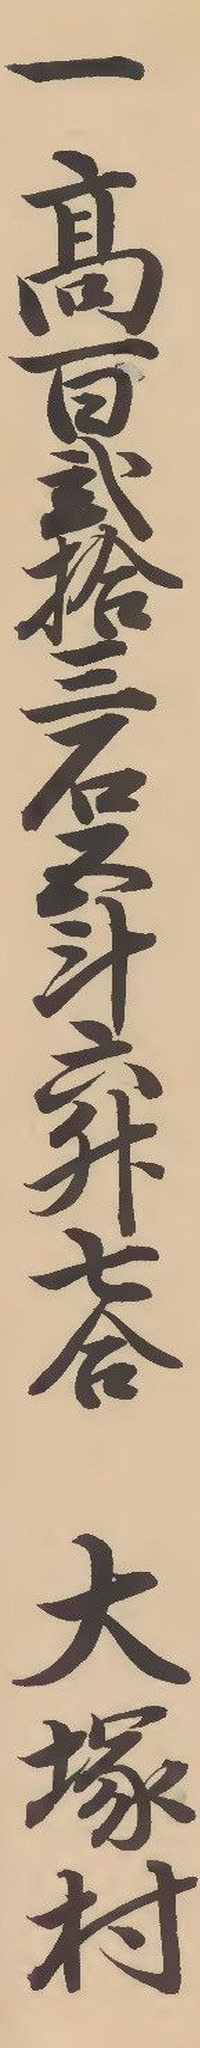一高百弐拾三石五斗六升七合大塚村
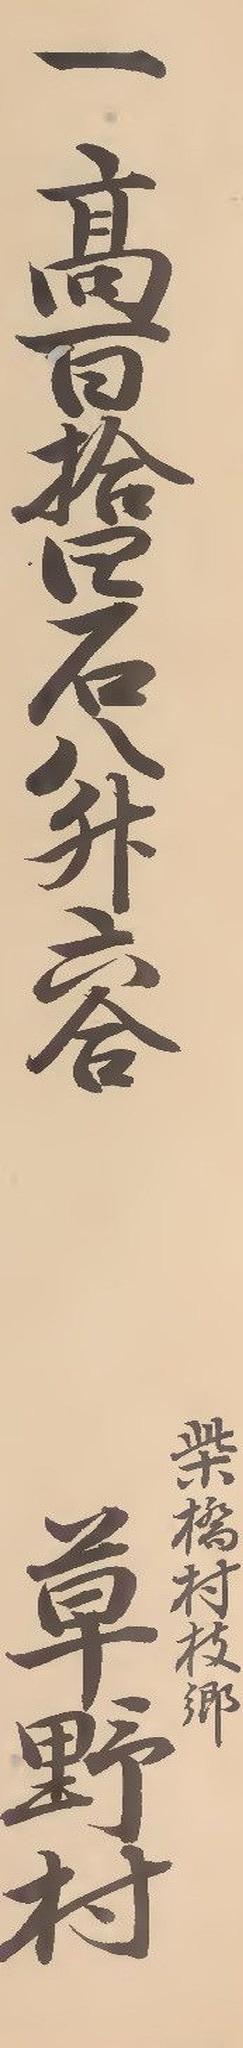一高百拾四石八升六合草野村
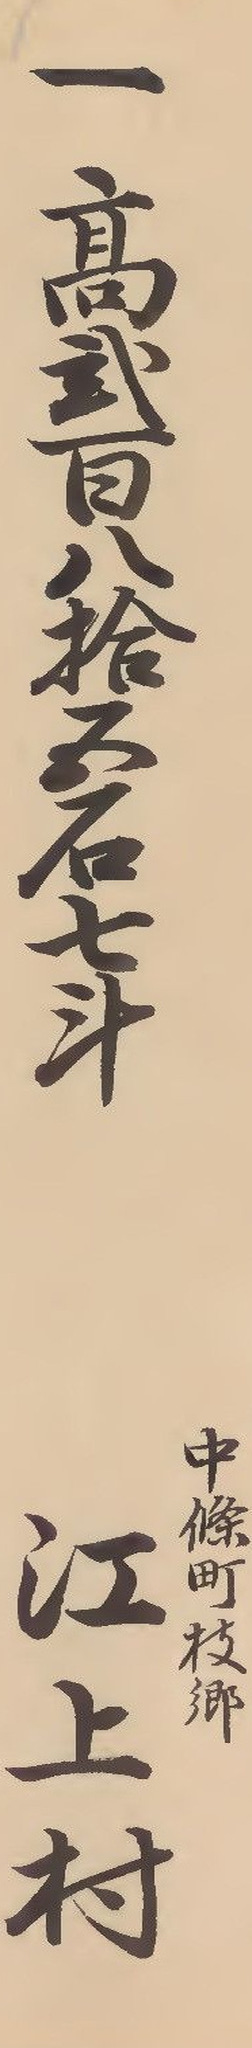一高弐百八拾五石七斗江上村
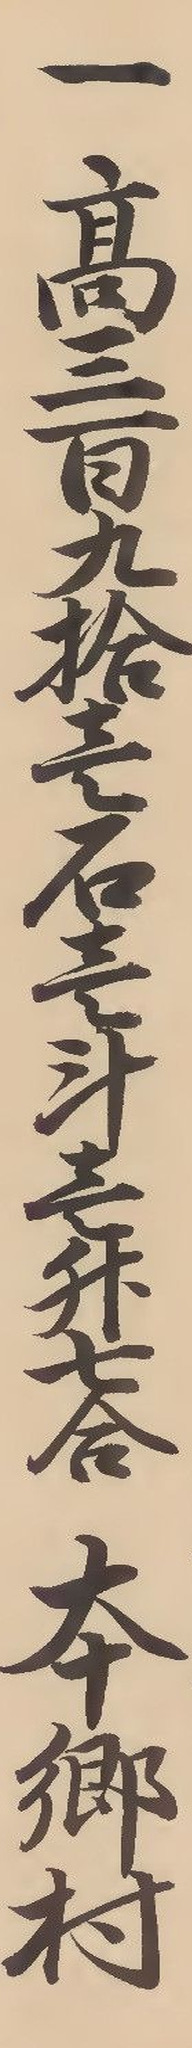一高三百九拾壱石壱斗壱升七合本郷村
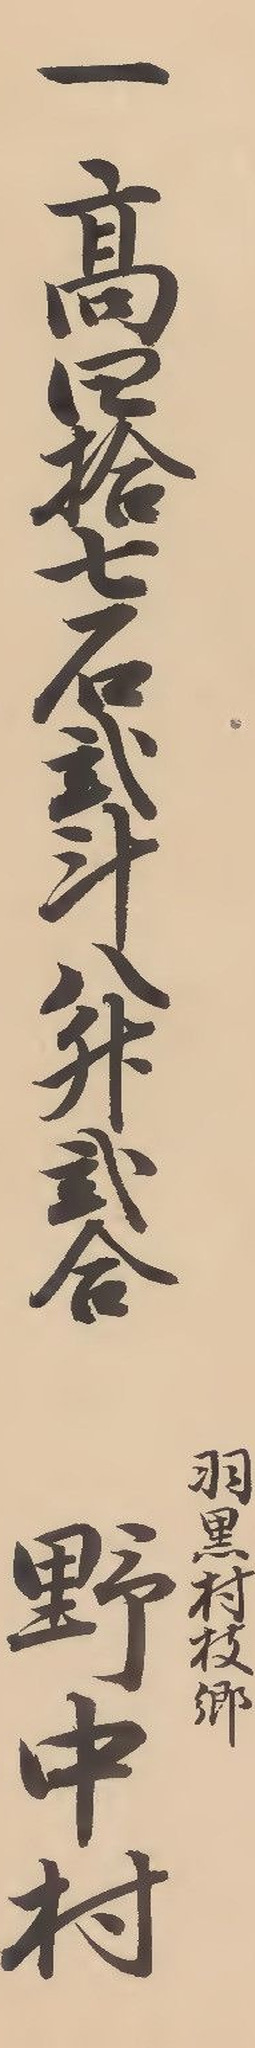一高四拾七石弐斗八升弐合野中村

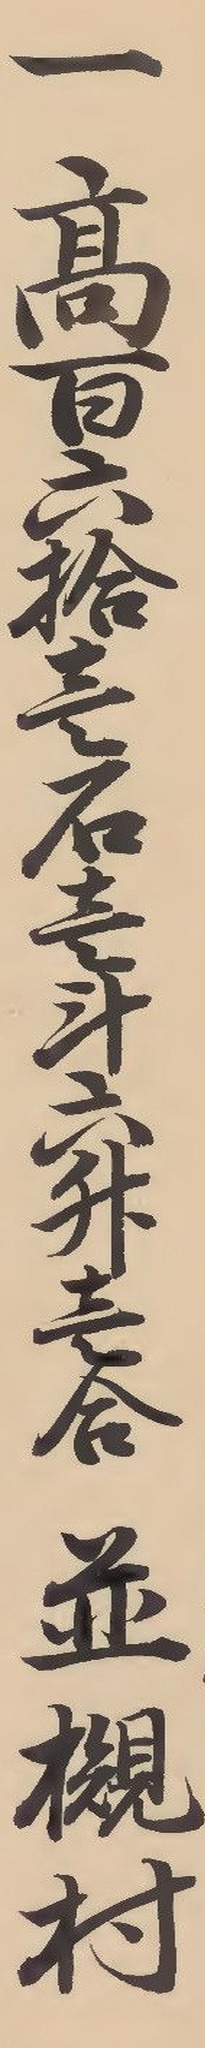一高百六拾壱石壱斗六升壱合並槻村
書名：越後国郷帳　下
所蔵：国立公文書館 National Archives of Japan
